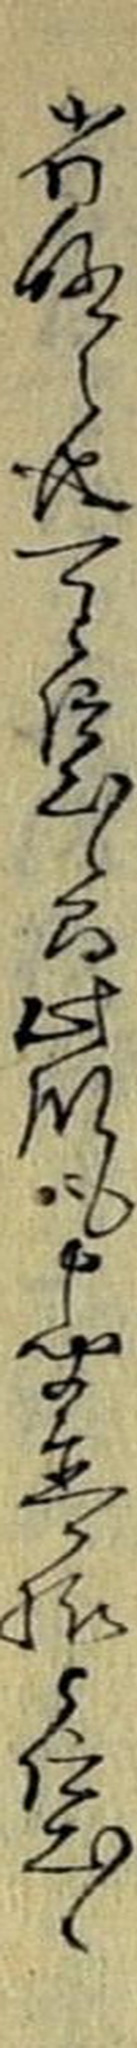省略之儀可被仰出候間此段も申聞置候様被仰出候
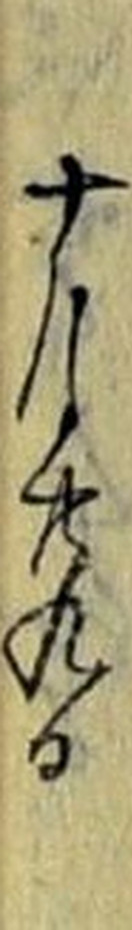十月廿九日
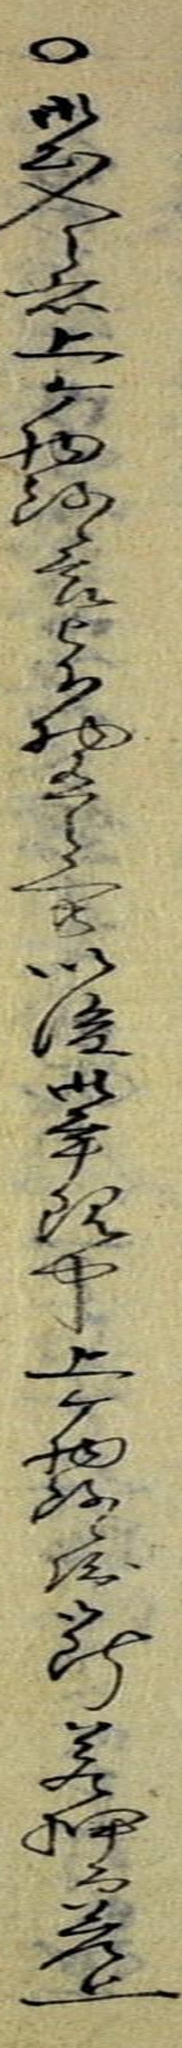○御出入之者上ヶ物致候節被下物有之候へ共以後御年限中上物致候儀御断若押而差上
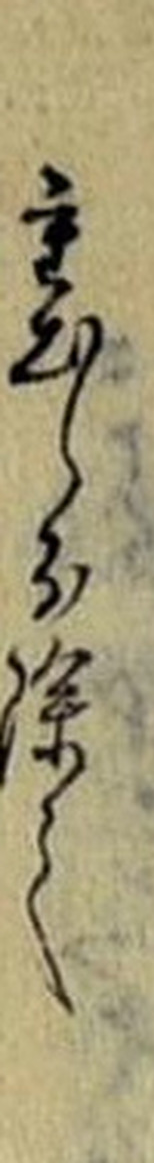重出之分除之
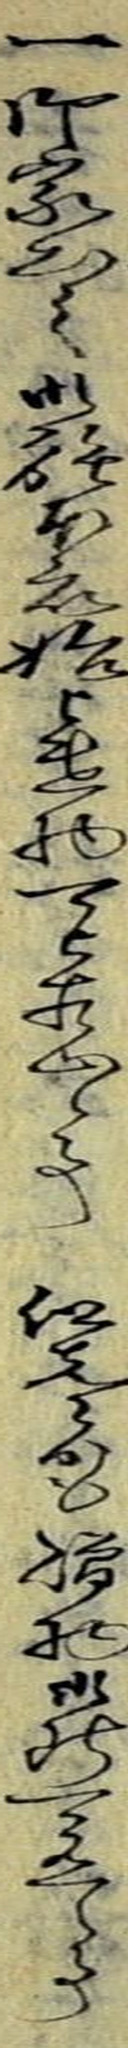一御家出之御籏本衆始被遣物可被相止候事但先々ゟも贈物御断可有之事
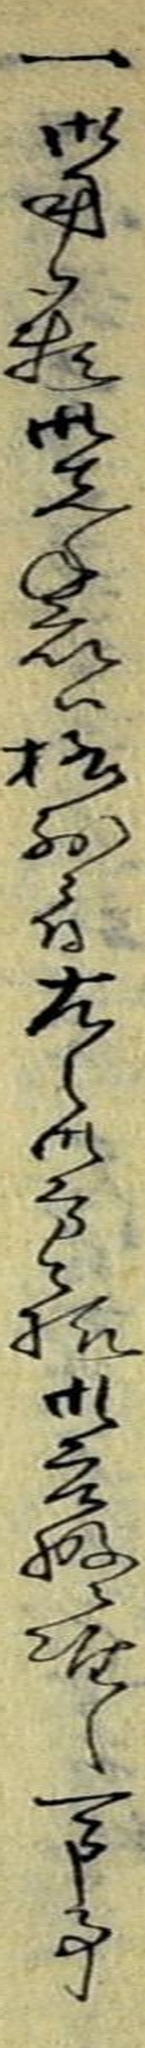一御用御頼御先手衆は格別に付右之御方々様御取扱に准し可申事
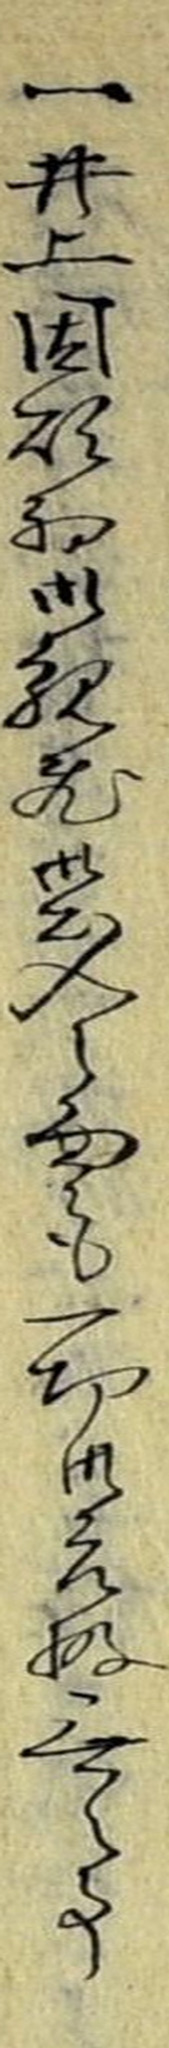一井上因碩初御親敷御出入之面々も一切御取扱無之事
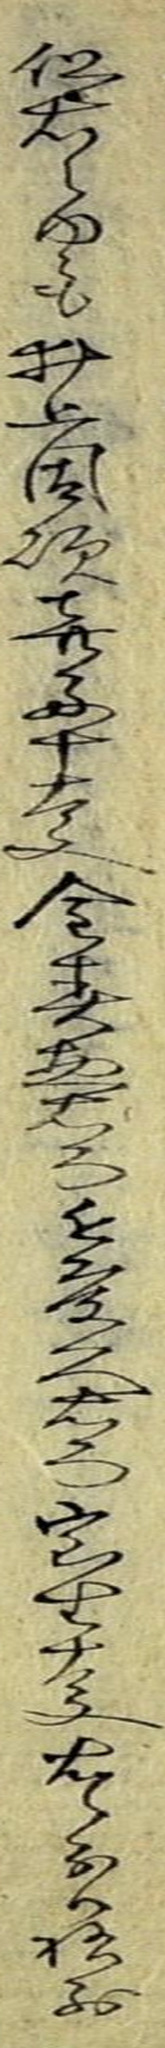但右之内にも井上因碩喜多十太夫金森惣右衛門近藤久右衛門宝生太夫右之分は格別
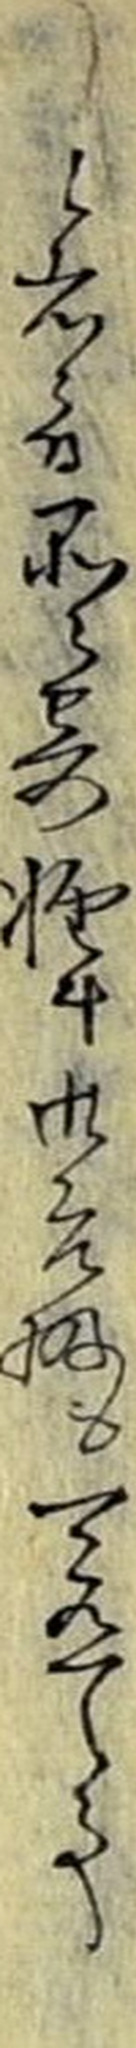之者に付所に寄軽キ御取扱も可有之事
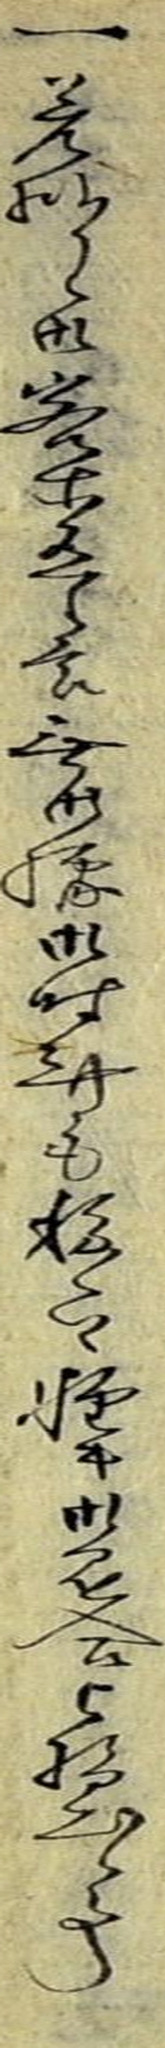一差掛り候御客等有之候節無御拠御時刻にも移候はヽ軽キ御懸合被指出候事
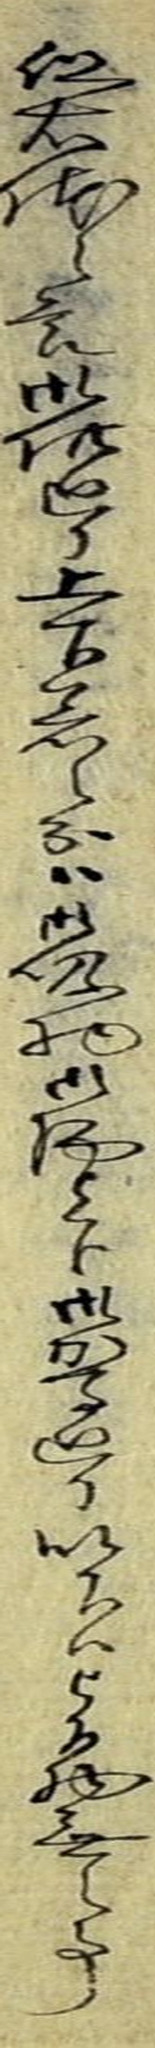但右体之節御供廻り上下着之分は御吸物御酒被下御駕廻り以可は被下物無之事
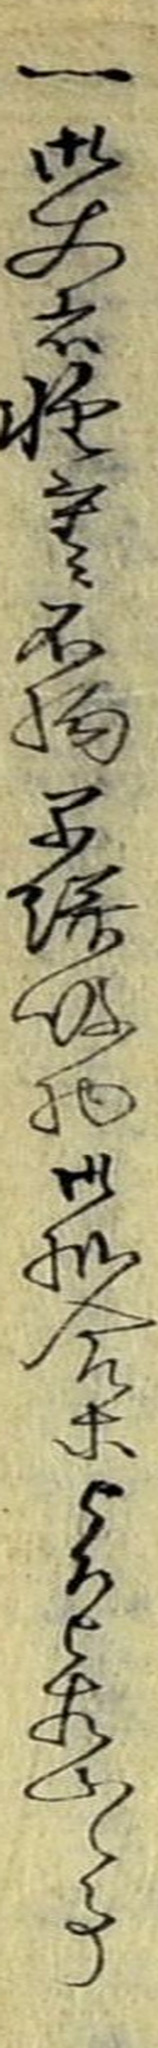一御使者軽重に不拘草餅吸物御掛合等被下被相止候事
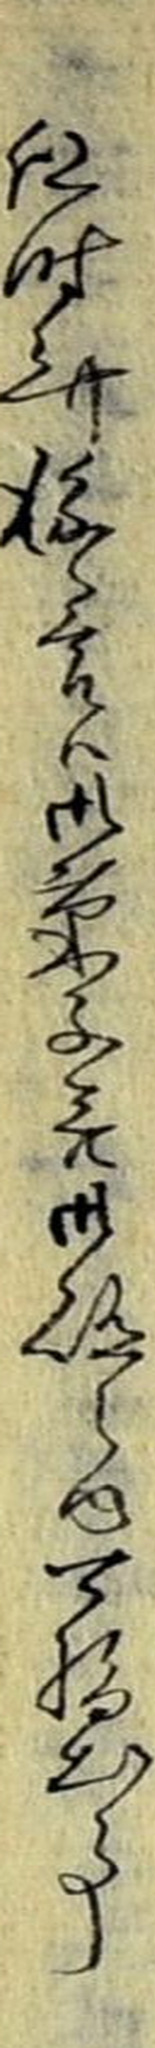但時刻移候節は御菓子并御賄之内可指出事
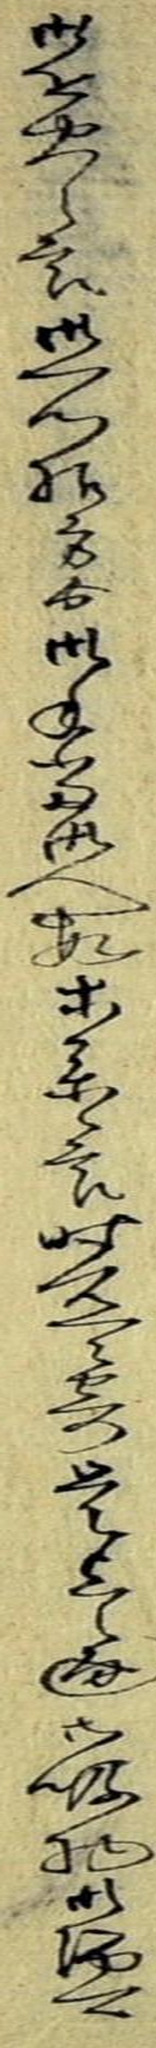一御近火之節御一門様方ゟ御手当御人数等参候節時宜に寄是迄之通御吸物御酒可

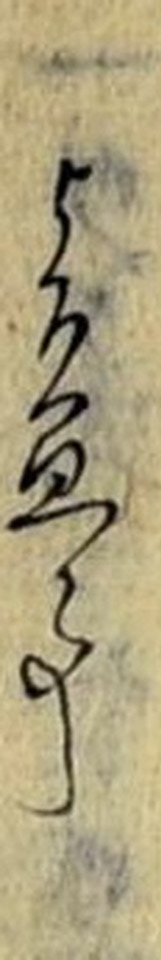被下置事
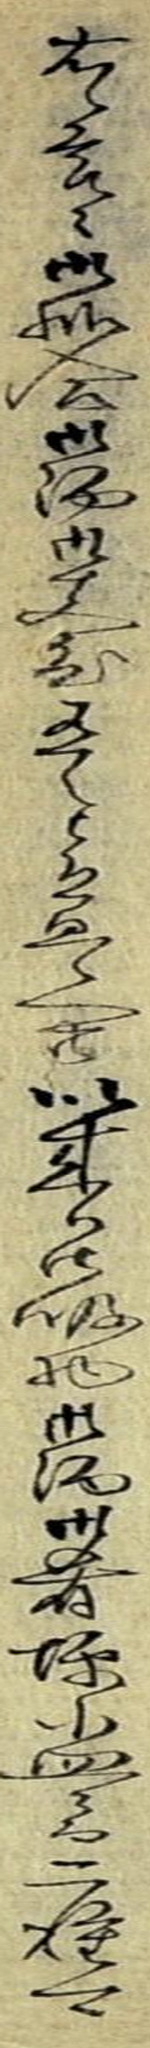右之節に御掛合御酒御支度有之被下置候へ共以来は御吸物御酒御肴採小皿に而二種可
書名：命令之部 四
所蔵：福井県文書館 Fukui Prefectural Archives
